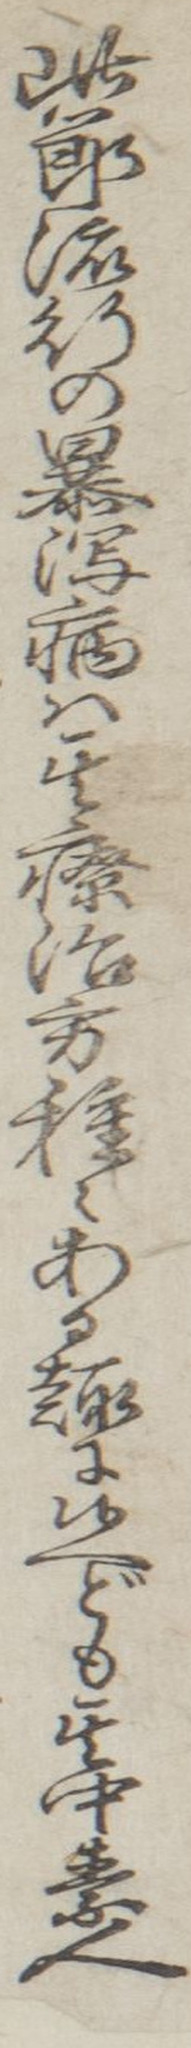此節流行の暴瀉病は其療治方種々ある趣に候へども其中素人
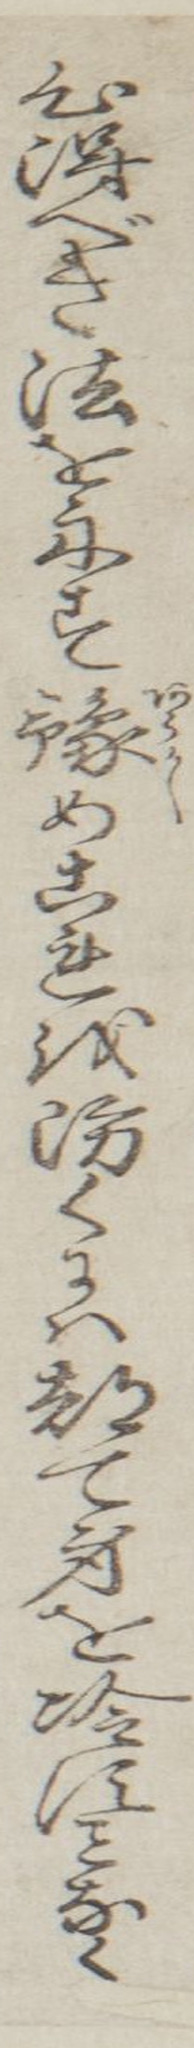心得べき法を示す豫めこれを防くには都て身を冷すことなく
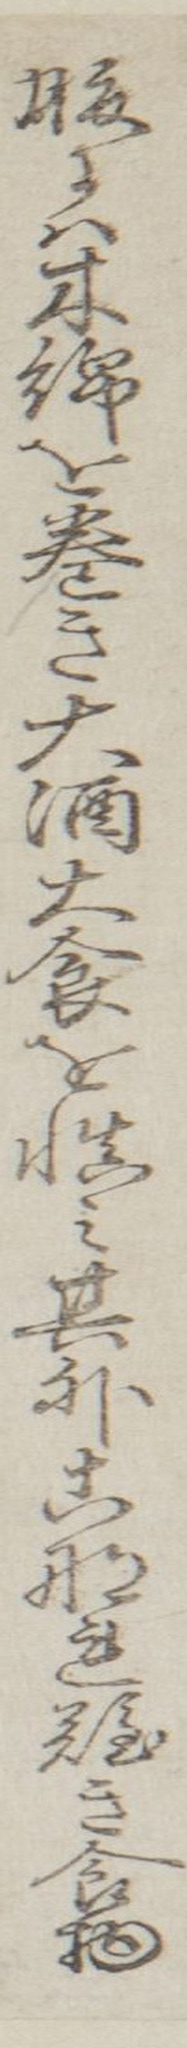腹には木綿を巻き大酒大食を慎み其外こなれ難き食物
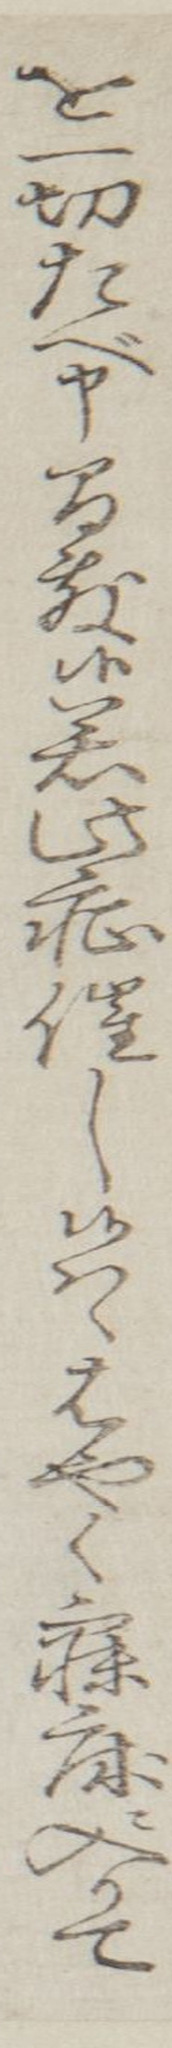を一切たべ申間敷候若此症催し候はゝはやく寝床に入りて
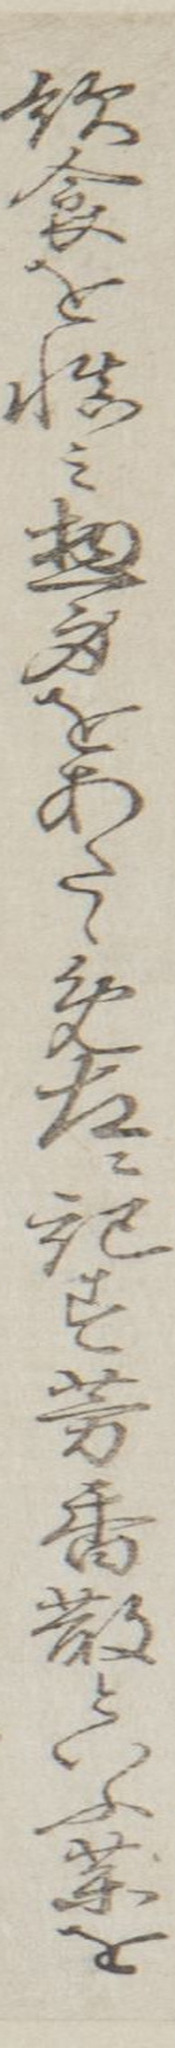飲食を慎み惣身をあたゝめ左に記す芳香散といふ薬を
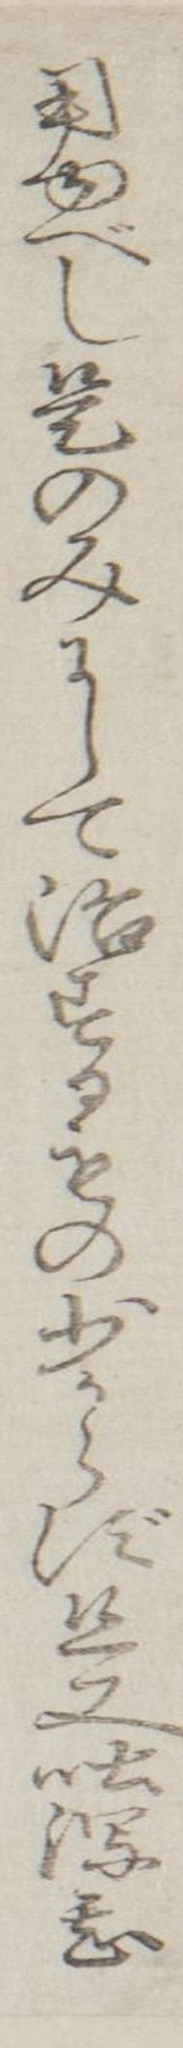用ゆべし是のみにして治するもの少からず且又吐瀉甚
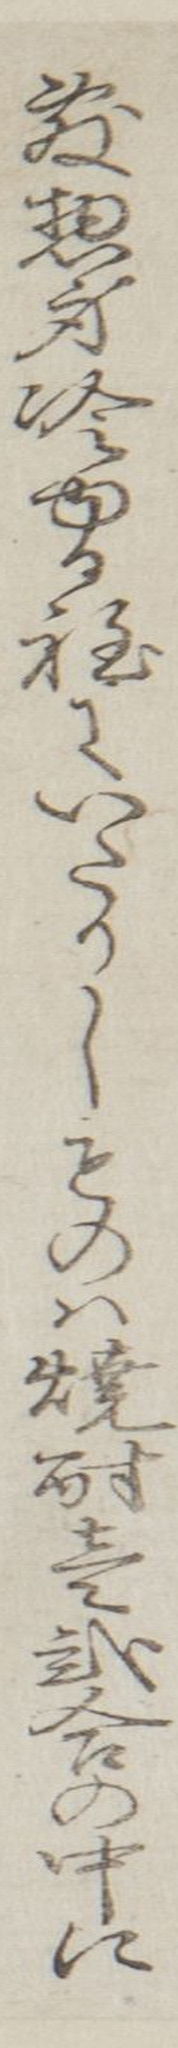敷惣身冷ゆる程にいたりしものはしょう焼酎壱弐合の中に
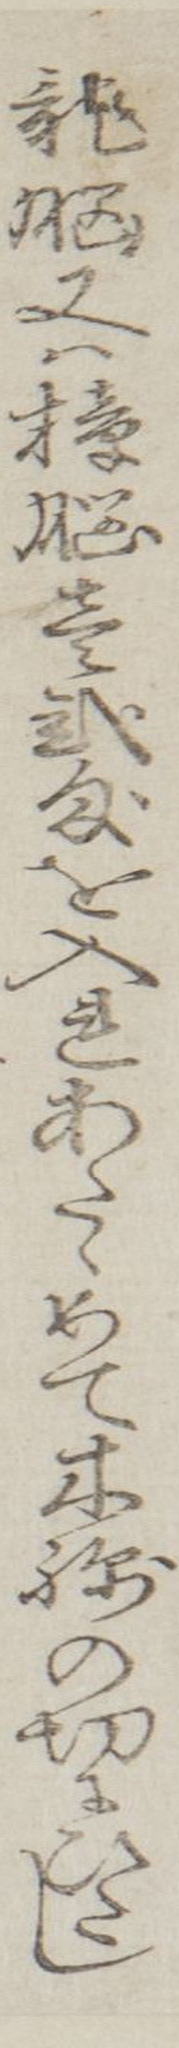龍脳又は樟脳壱弐匁を入れあたゝめて木綿の切にひたし
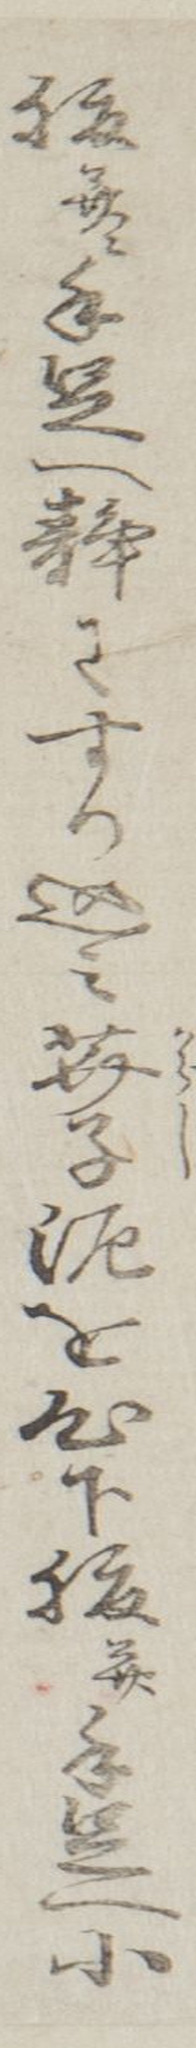腹并に手足へ静にすり込み芥子泥を心下腹并手足へ小
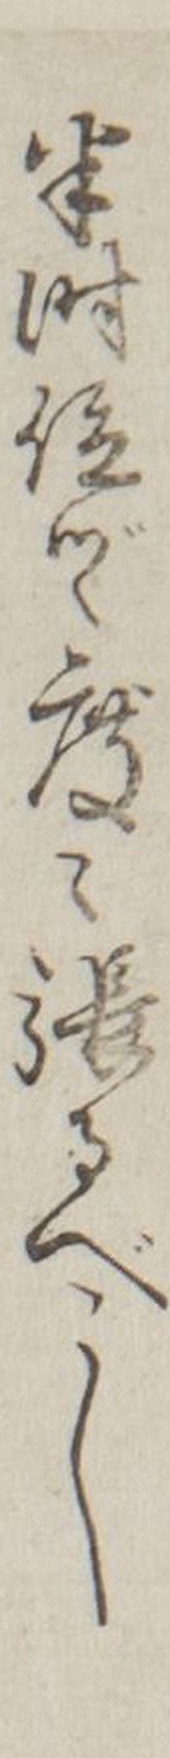半時位ヅヽ度々張るべし
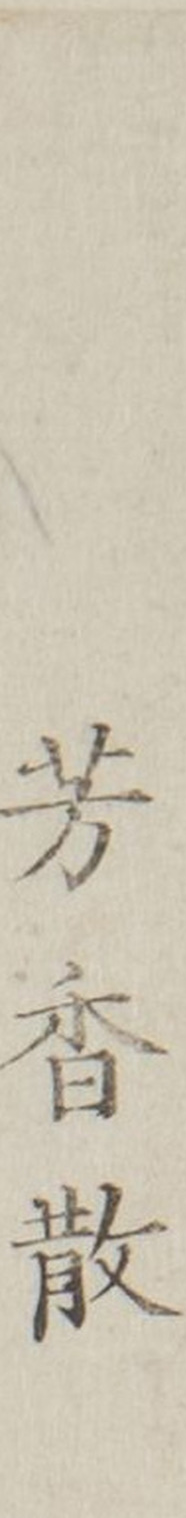芳香散
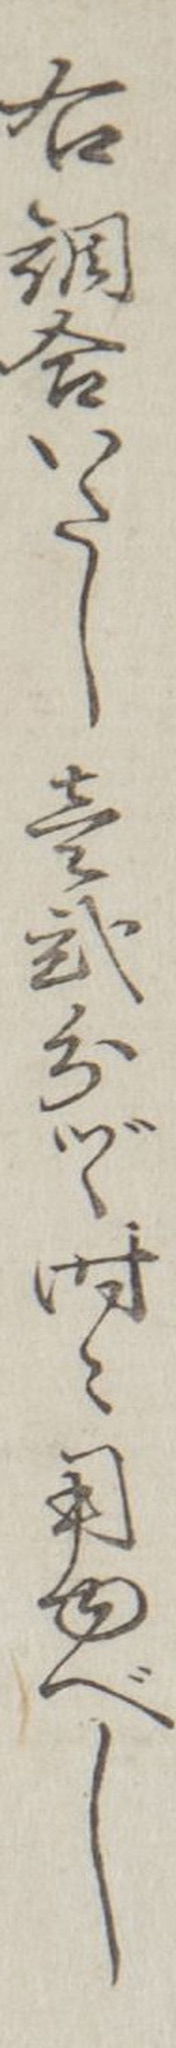右調合いたし壱弐分ヅヽ時々用ゆべし
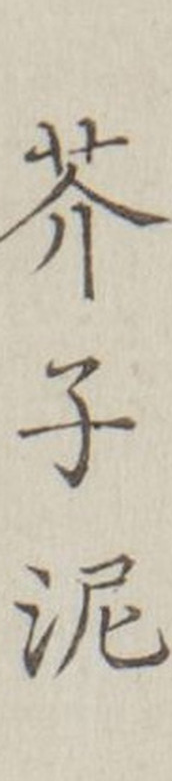芥子泥
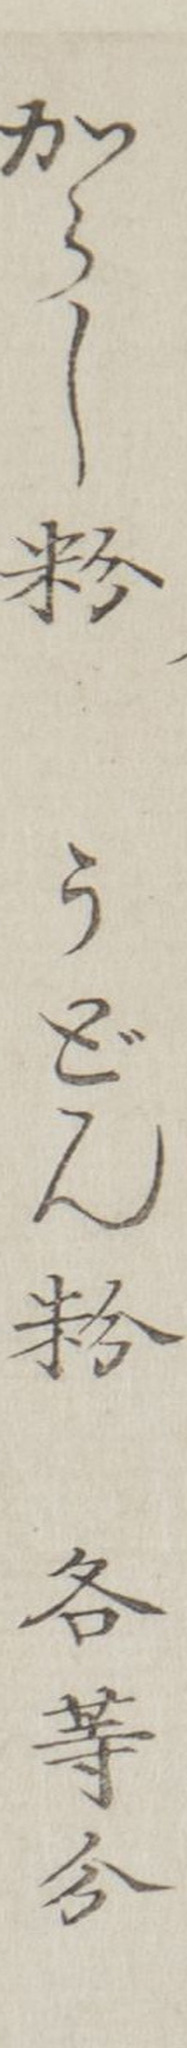からし粉うどん粉各等分
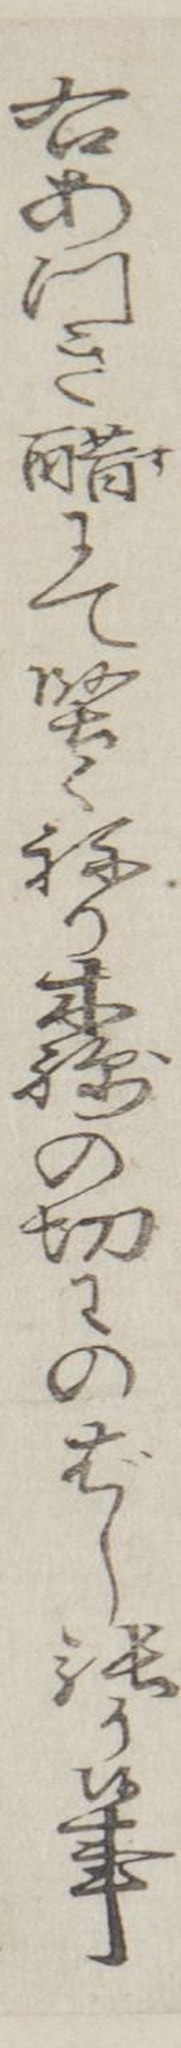右あつき醋にて堅くねり木綿の切にのばし張り候事
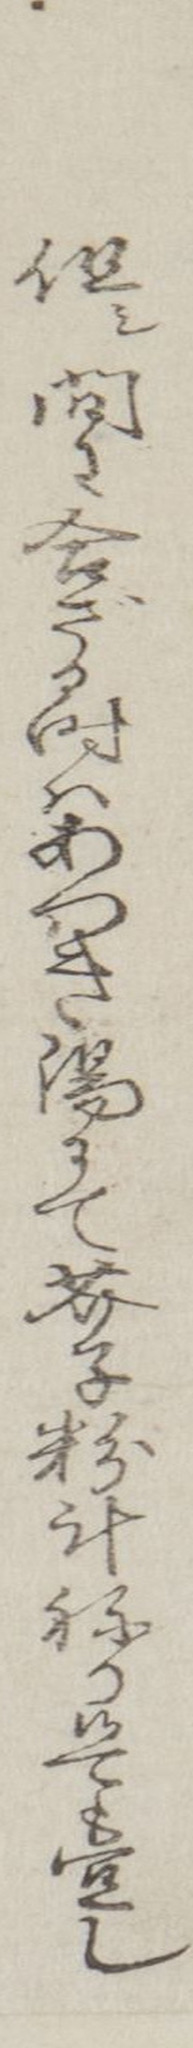但し間に合ざる時はあつき湯にて芥子粉計ねり候ても宜し
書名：流行暴瀉病療治方
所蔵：あいおいニッセイ同和損保株式会社
